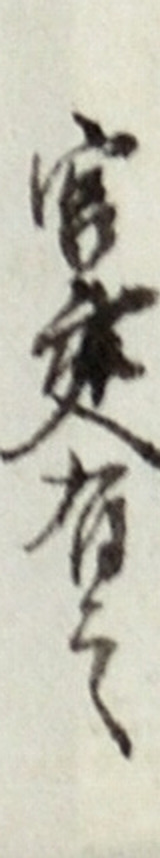宮建有之
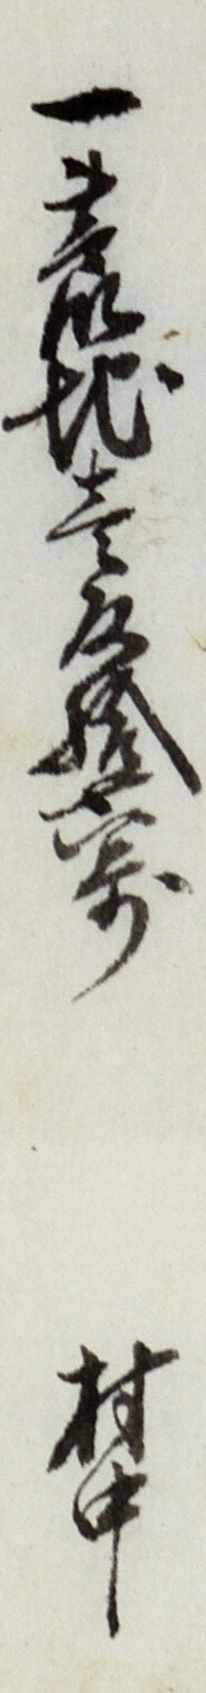一荒地壱反拾六歩村中
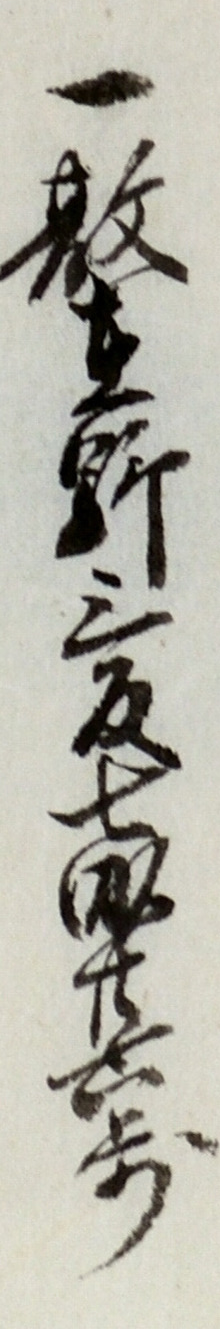一散在所三反七畝廿六歩

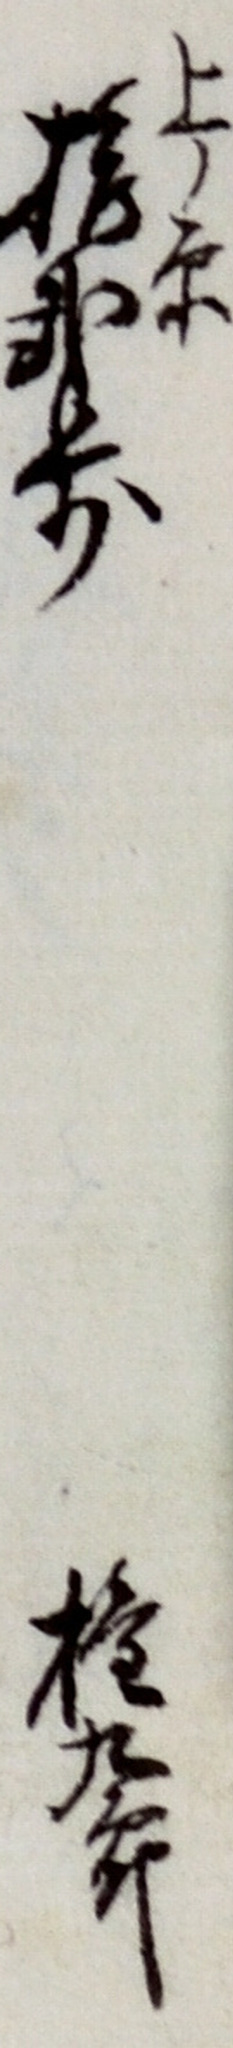拾弐歩権九郎

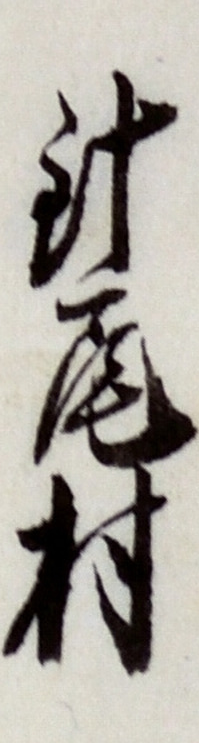針尾村
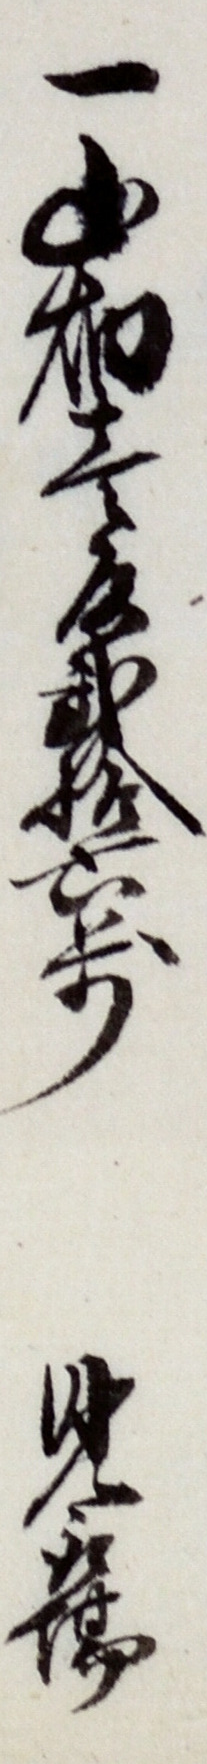一山畑壱反弐拾六歩見取場
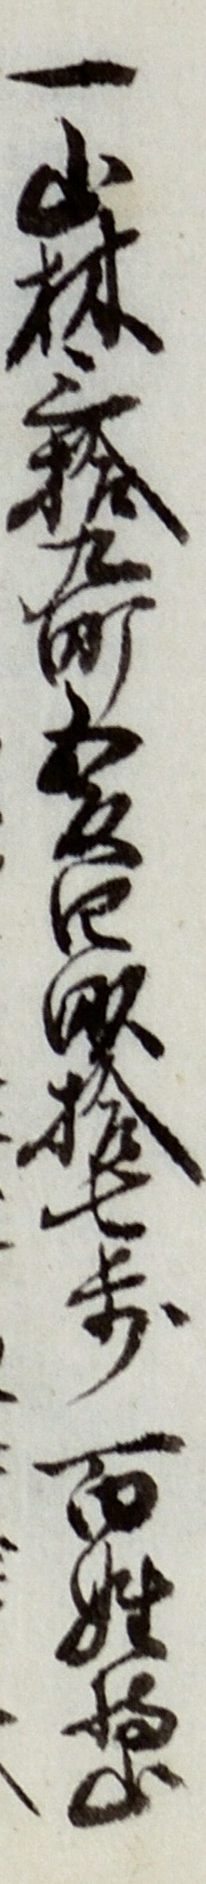一山林三拾九町五反四畝拾七歩百姓持山
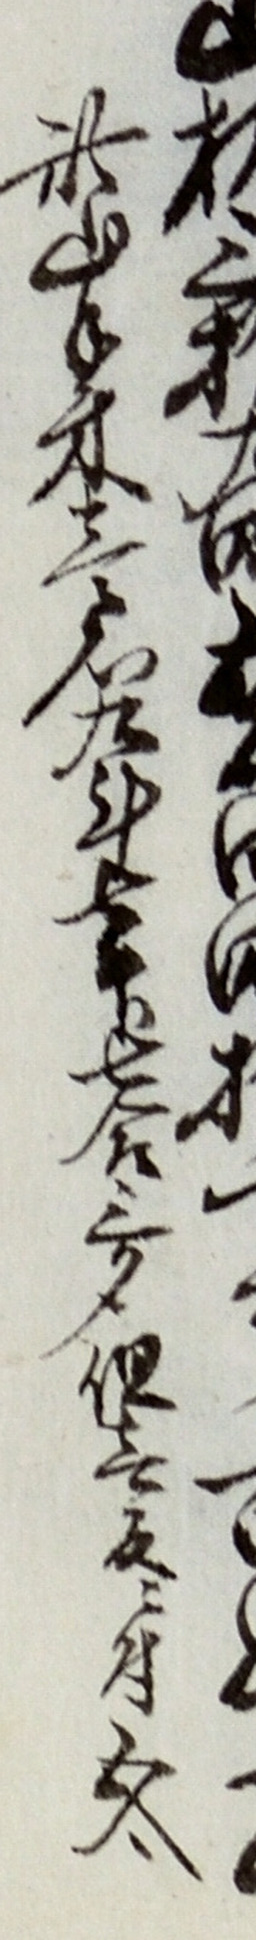此山手米壱石九斗七升七合三勺但壱反ニ付五合
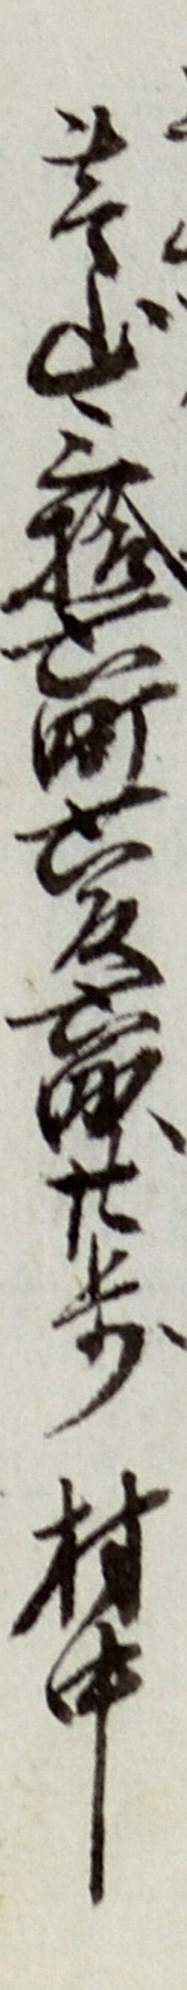芝山三拾六町六反六畝廿歩村中

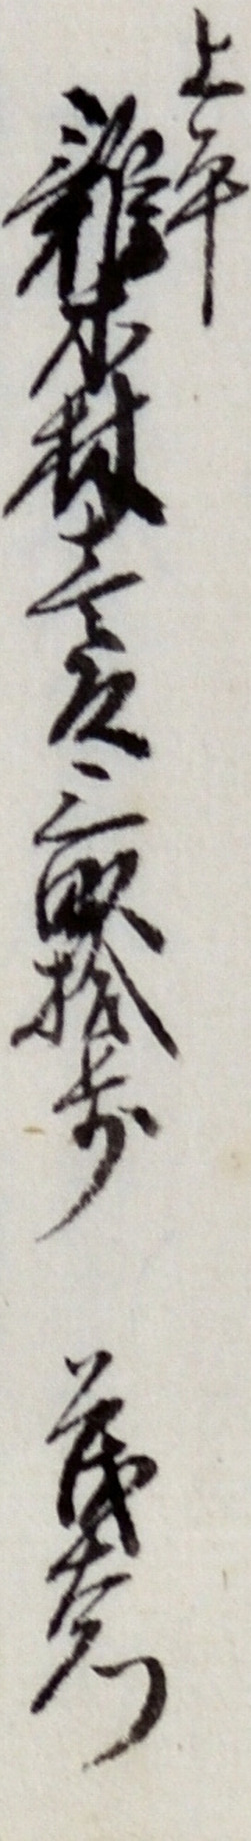雑木林壱反三畝拾歩茂右衛門
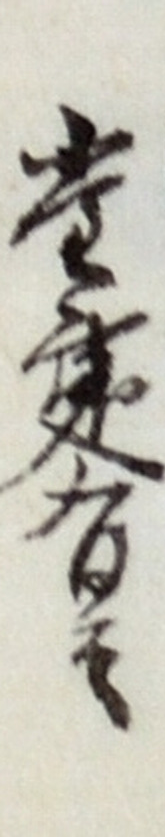堂建有之
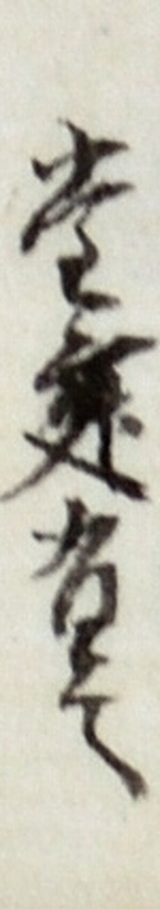堂建有之
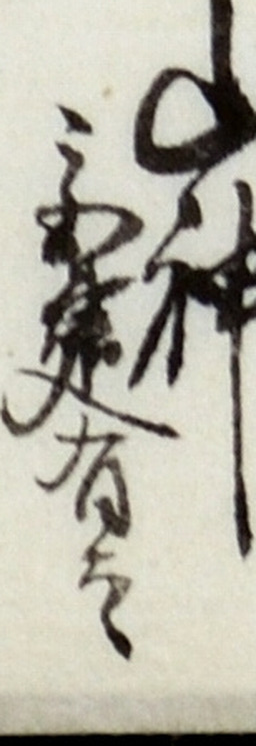宮建有之
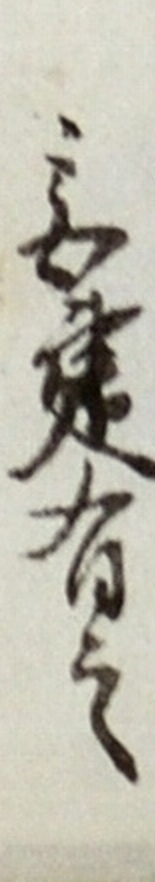宮建有之
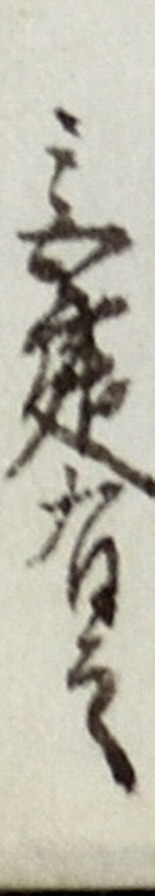宮建有之
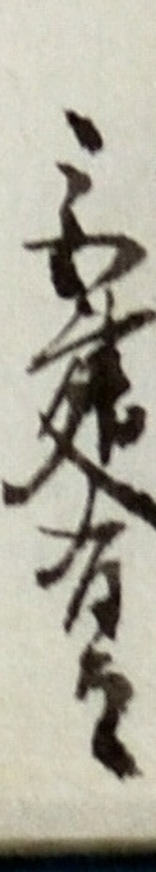宮建有之
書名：御領分中山林社地手控
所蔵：伊那市立高遠町図書館・合同会社AMANE
